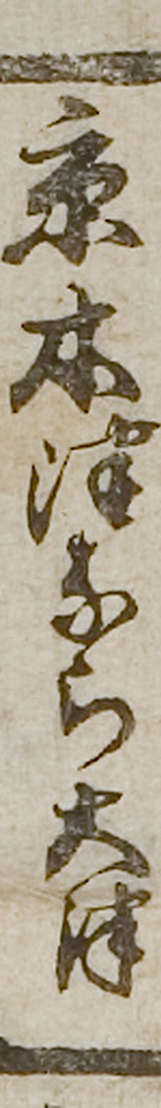京木津なら大津
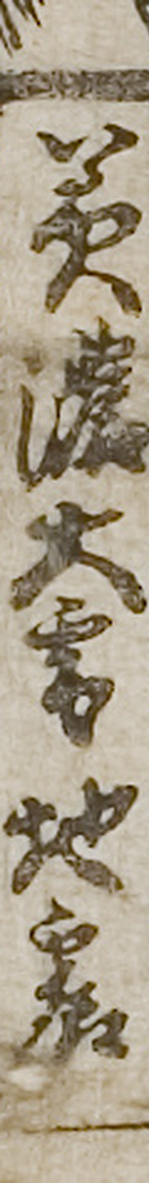美濃大雪地震
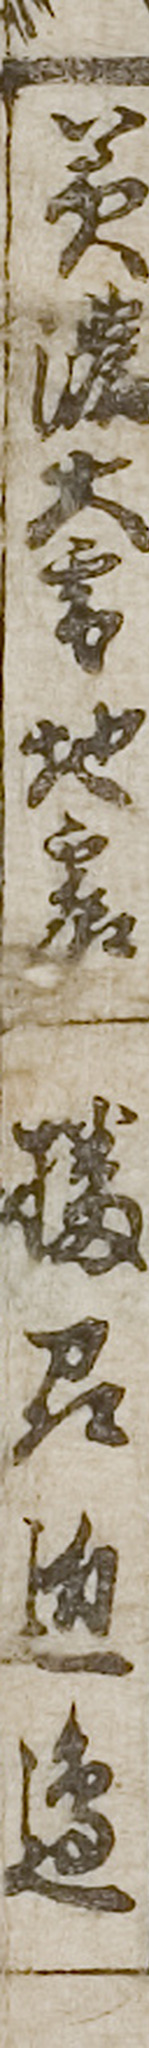播州近邊
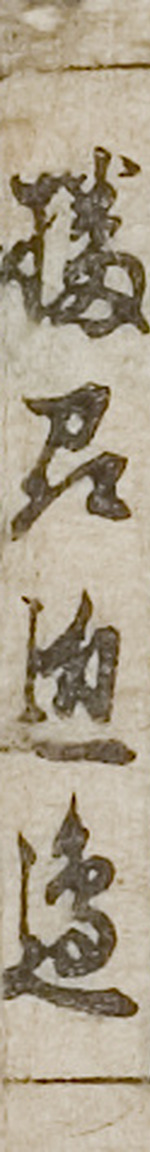播州近邊
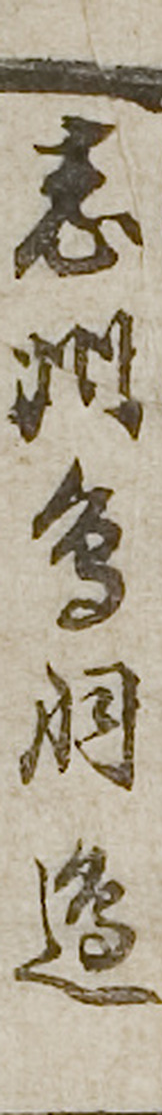志州鳥羽邊
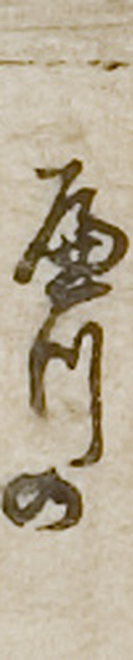へつの
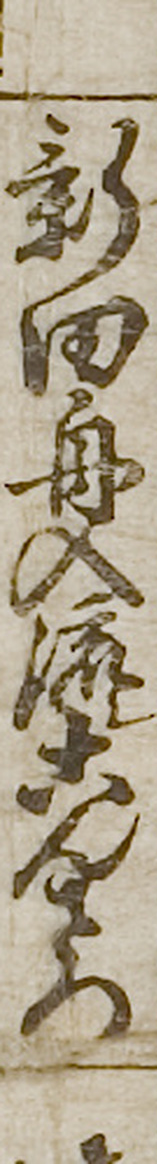新田舟入流レこんさつ
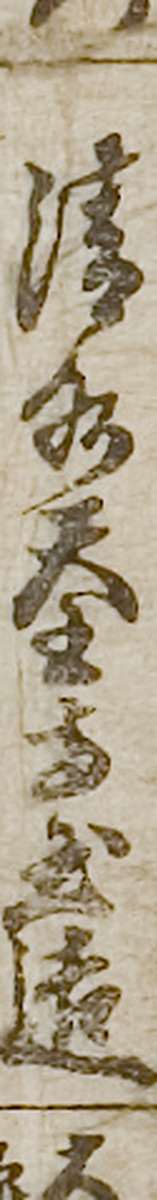清水天王寺玉造
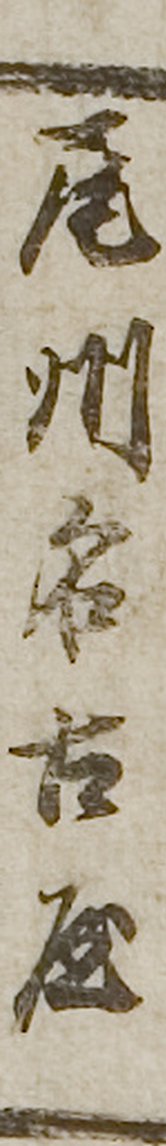尾州名古屋
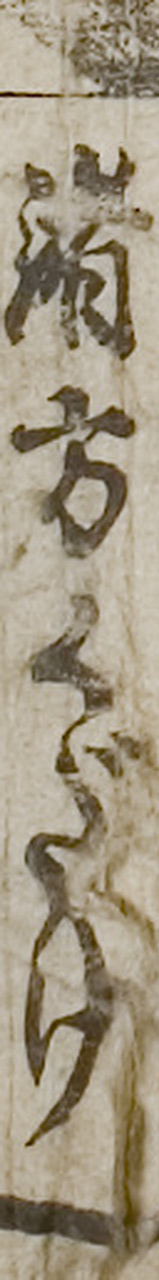諸方くだけ
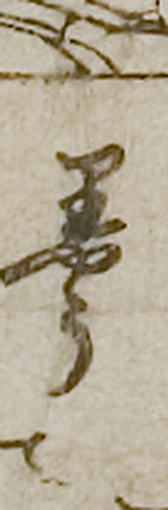りやう
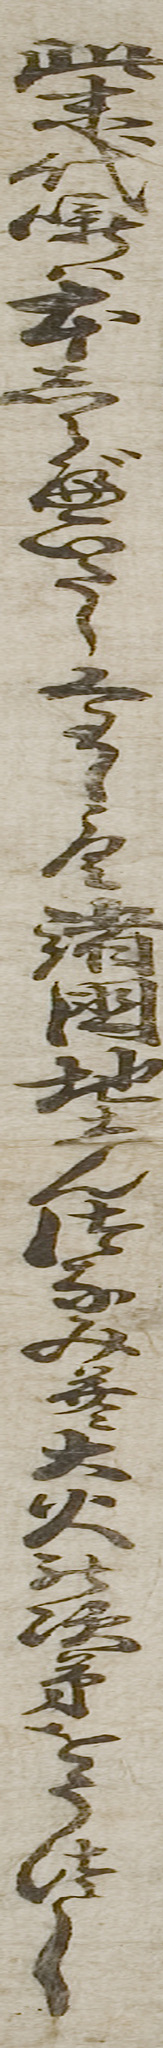此末代噺ハ本しらべいたしくわしく諸国地しんつなみ并ニ大火の次第をうつし
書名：諸国大地震大津波末代噺
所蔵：東京大学総合図書館 General Library in the University of Tokyo, JAPAN
